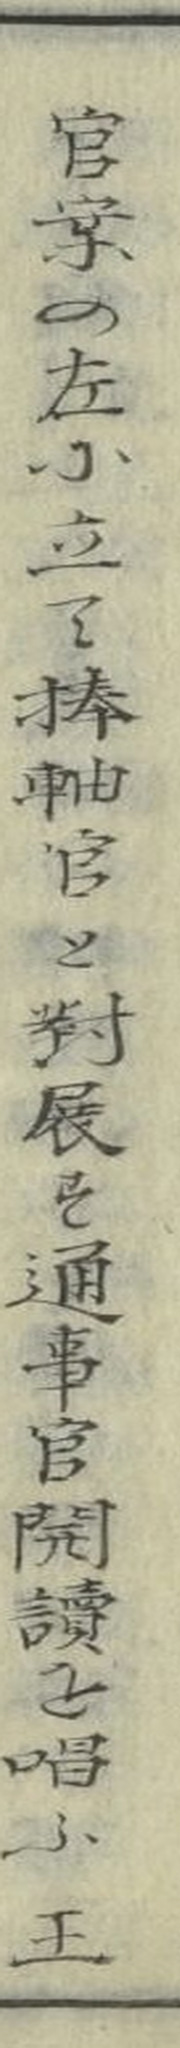官案の左に立て捧軸官と対展す通事官開読を唱ふ王
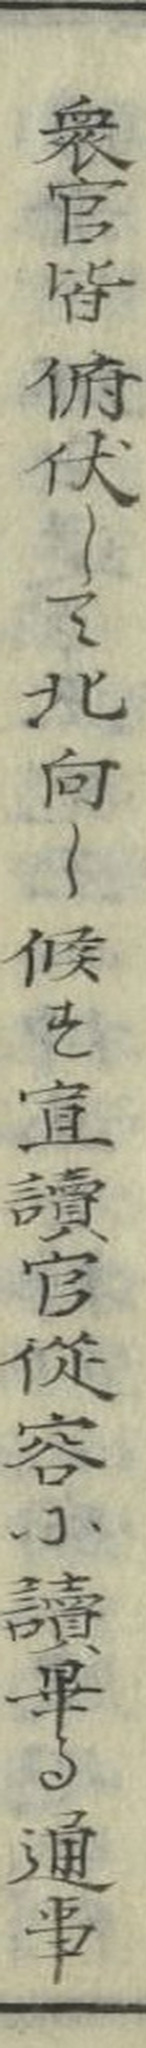衆官皆俯伏して北向し候す宣読官従容に読畢る通事
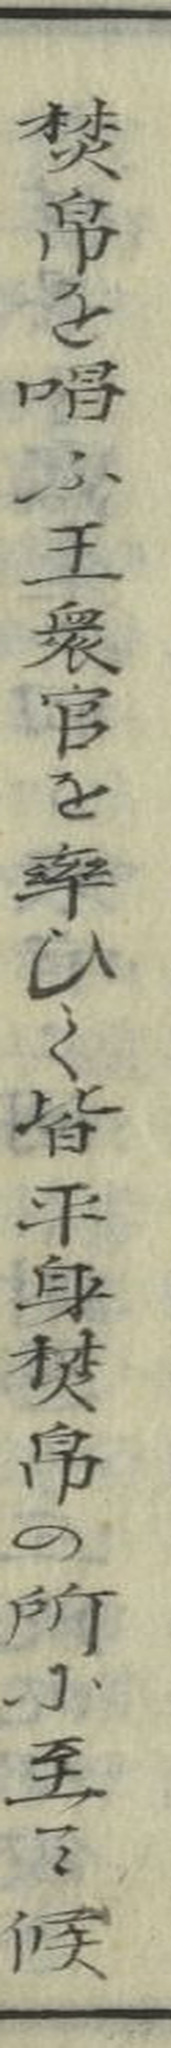焚帛を唱ふ王衆官を率ひて皆平身焚帛の所に至て候

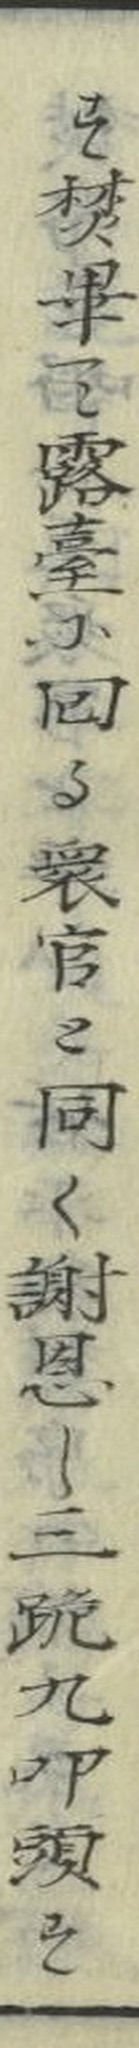す焚畢て露台に回る衆官と同く謝恩し三跪九叩頭す
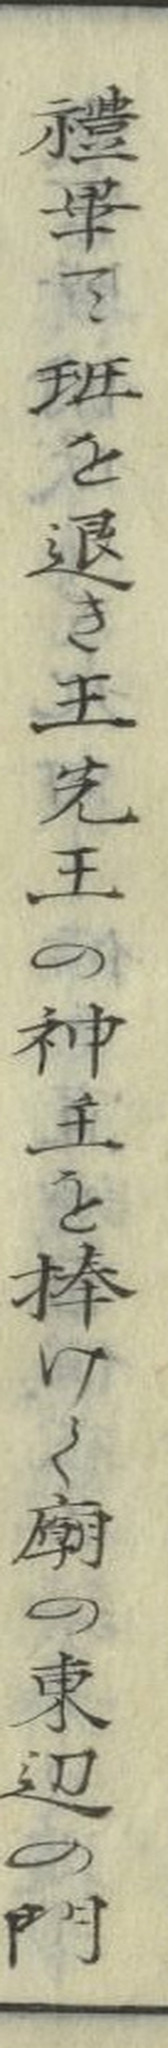礼畢て班を退き王先王の神主を捧けて廟の東辺の門
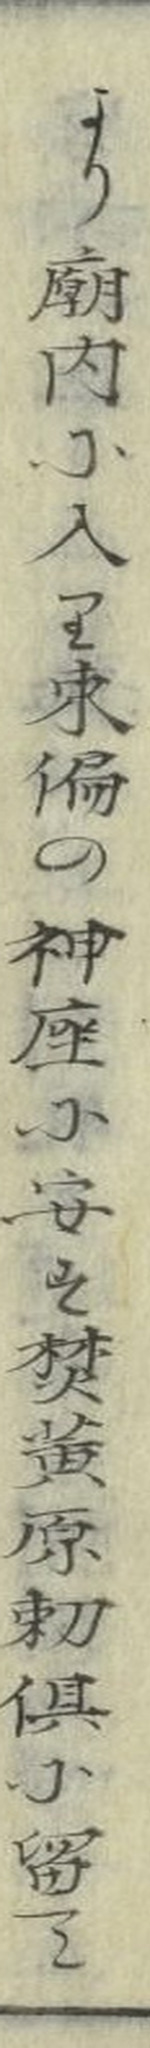より廟内に入り東偏の神座に安す焚黄原勅倶に留て
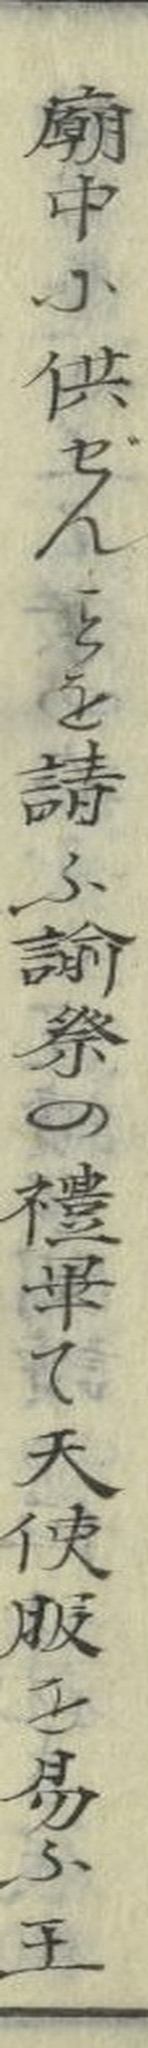廟中に供ぜんことを請ふ諭祭の礼畢て天使服を易ふ王
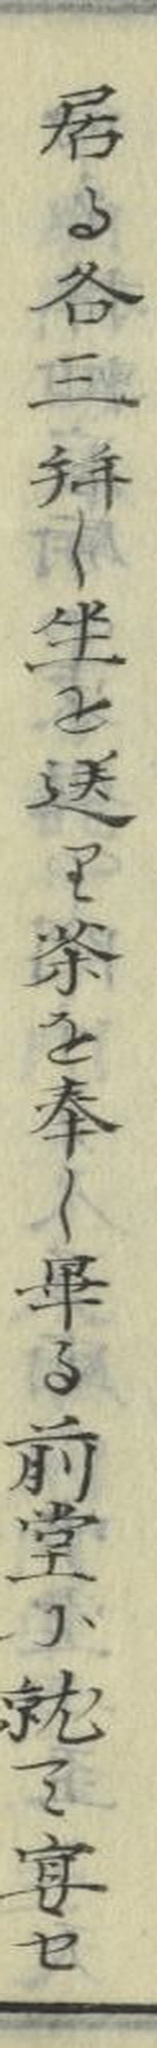居る各三拝し坐を送り茶を奉し畢る前堂に就て宴せ
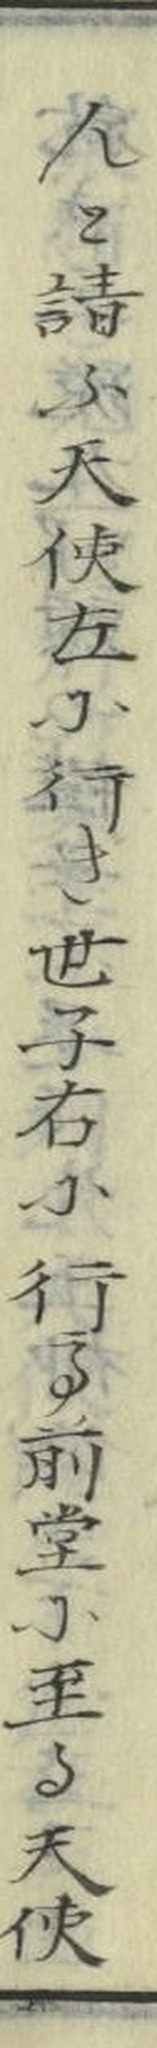んと請ふ天使左に行き世子右に行て前堂に至る天使
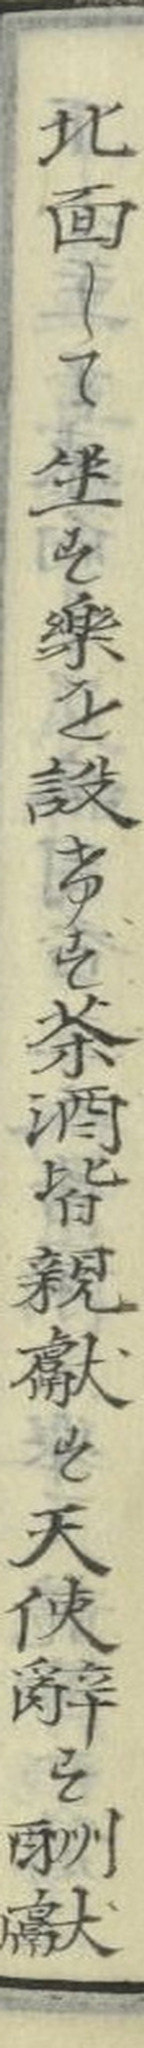北面して座す楽を設けす茶酒皆親献す天使辞す酬献
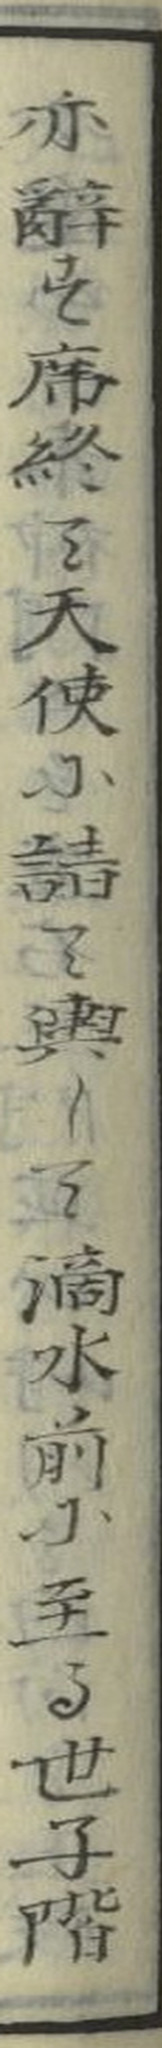亦辞す席終て天使に請て輿して滴水前に至る世子階
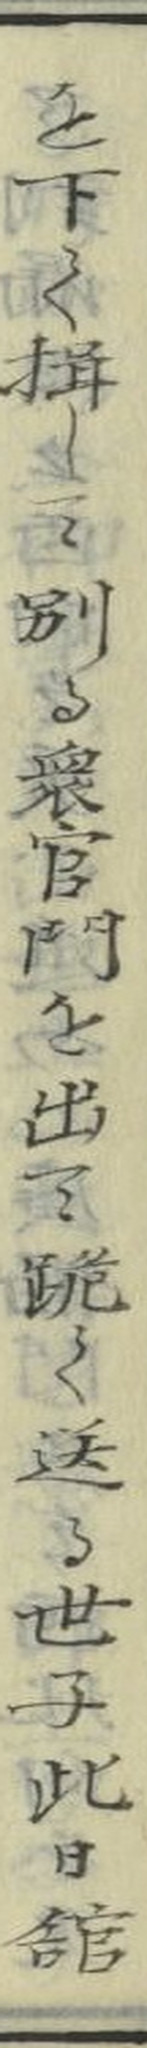を下て揖して別る衆官門を出て跪て送る世子此日館
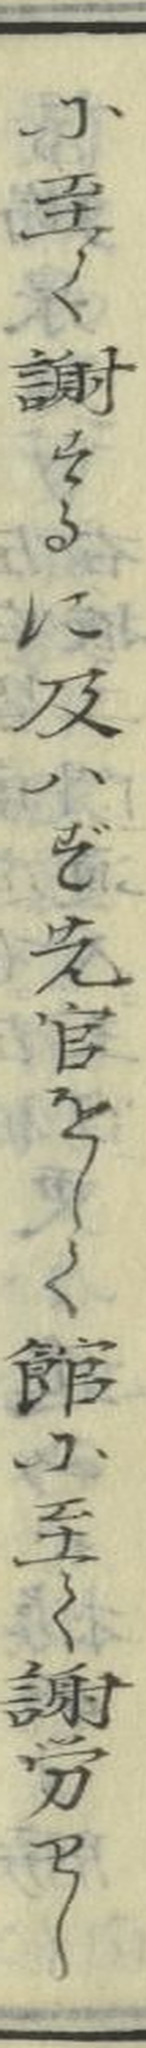に至て謝するに及はず先官をして館に至て謝労せし
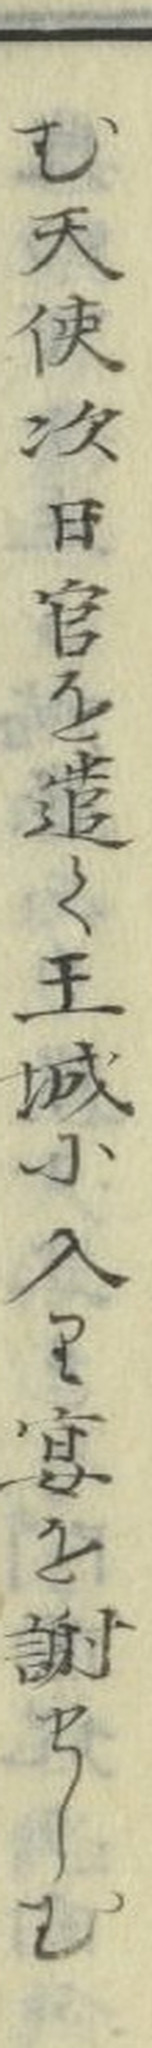む天使次日官を遣て王城に入り宴を謝せしむ
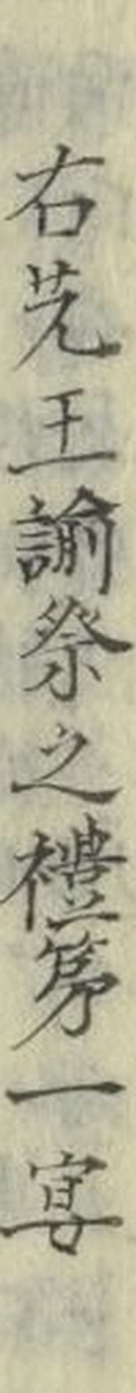右先王諭祭之礼第一宴
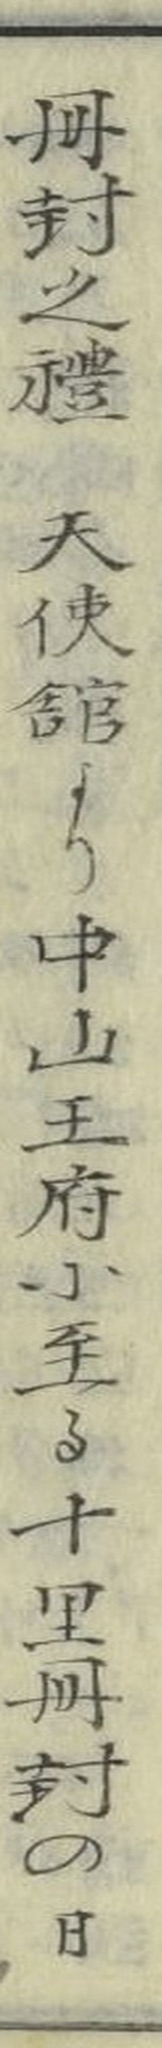冊封之礼天使館より中山王府に至る十里冊封の日
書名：琉球沿革志 下
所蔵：University of the Ryukyus Library
